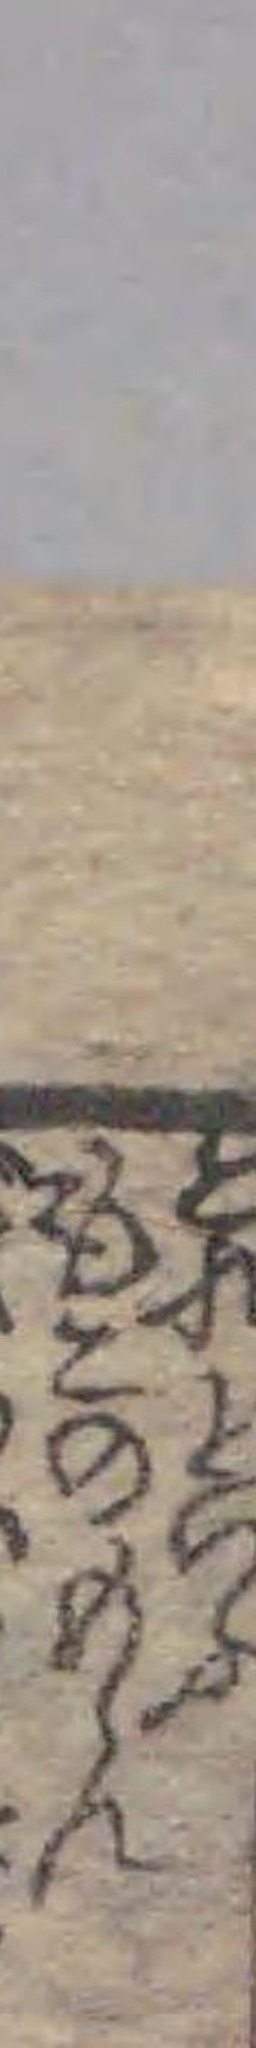もこのもゝん
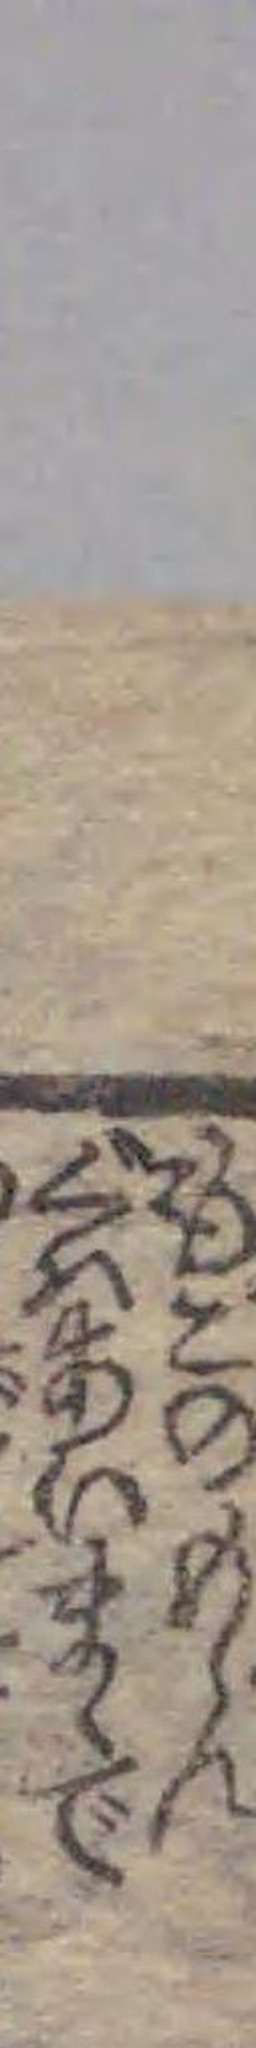ぐはあいまゝで
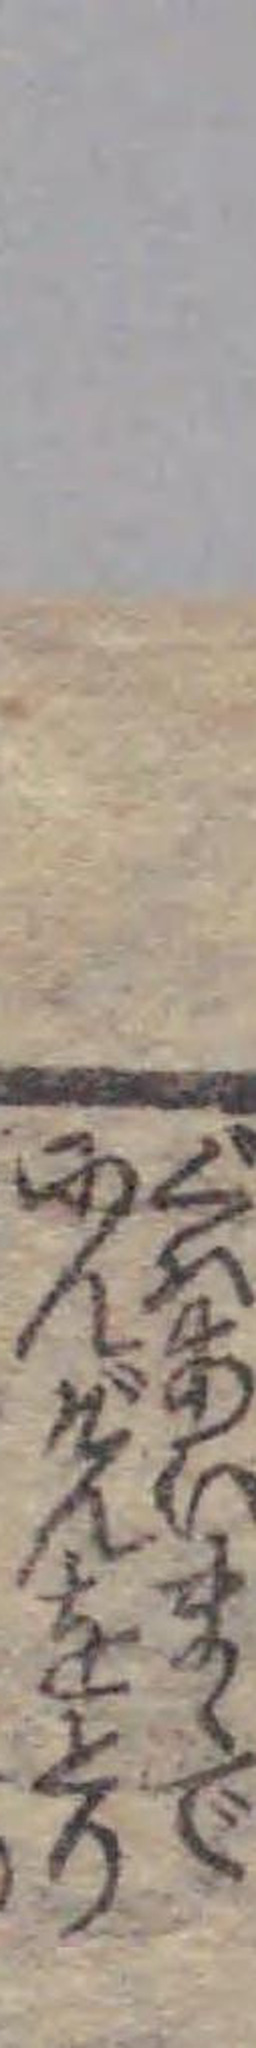にんげんをとり
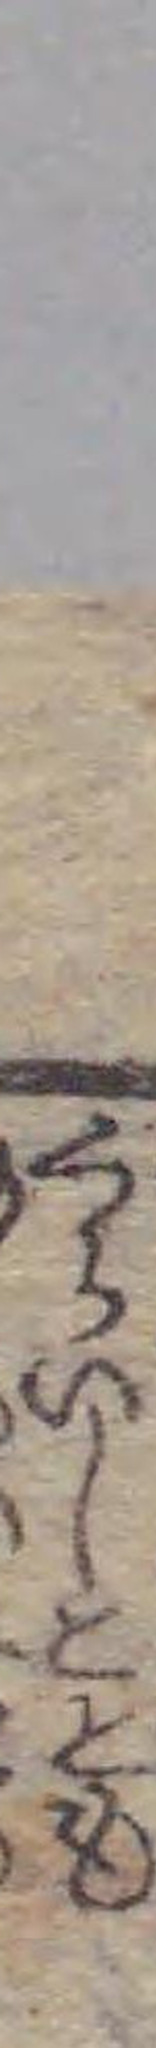くらいしことも
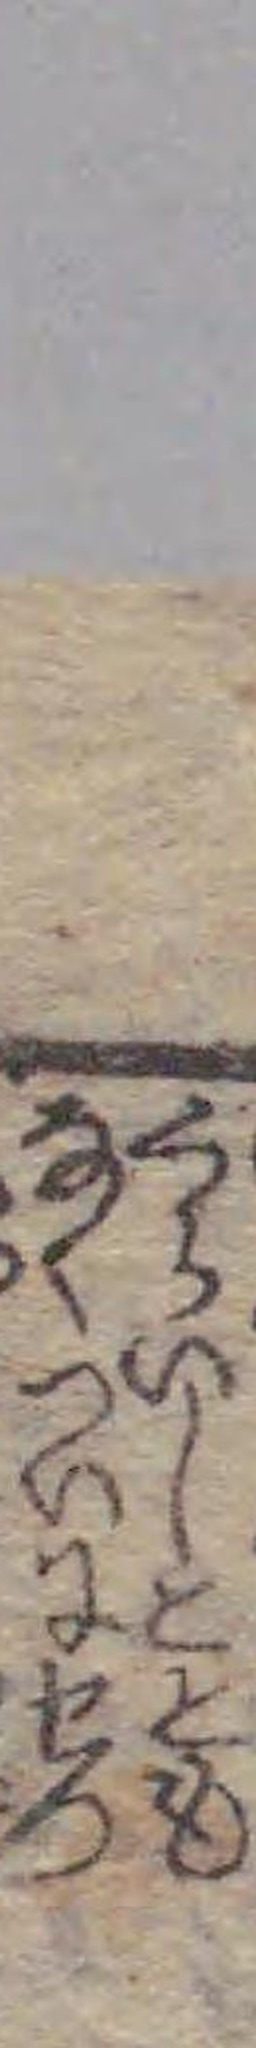なくついにせつ
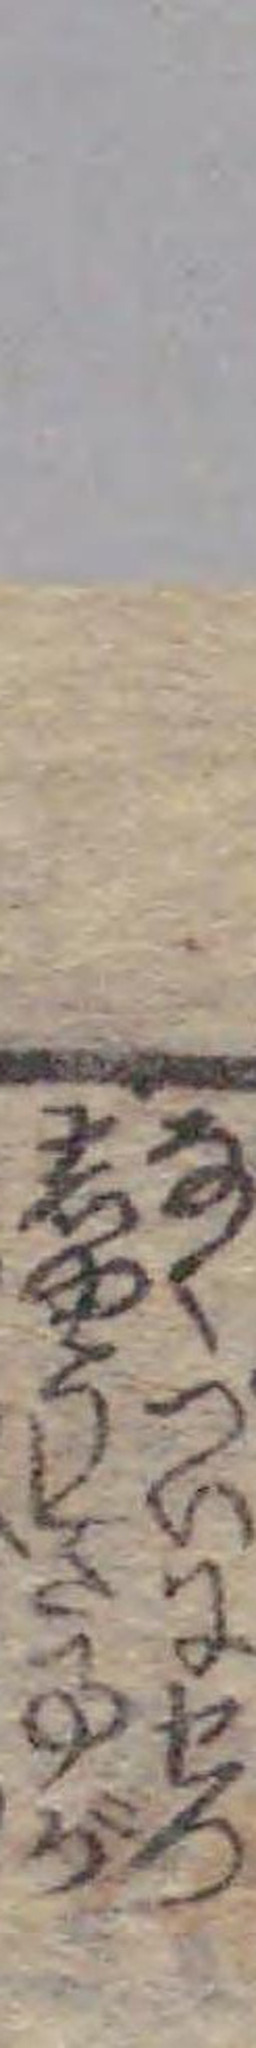しいやうした事が
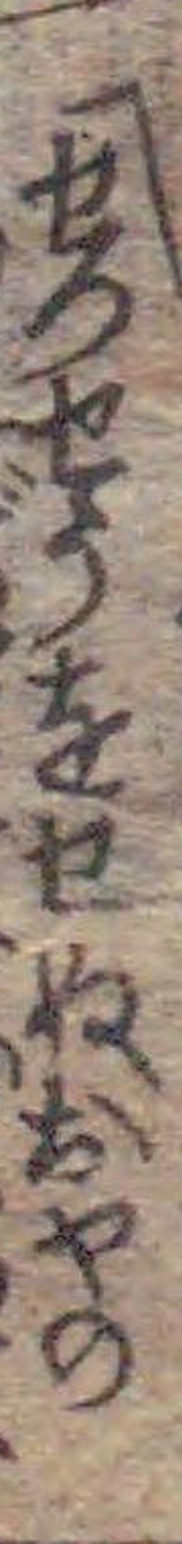〽せつせうをせぬおやの
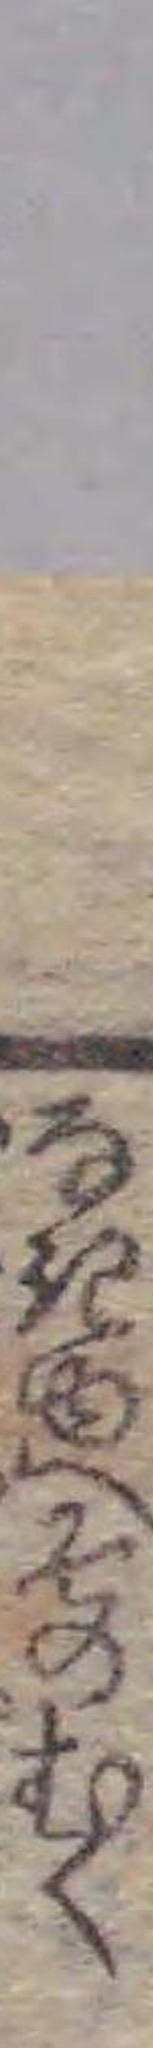なきゆへそのむく
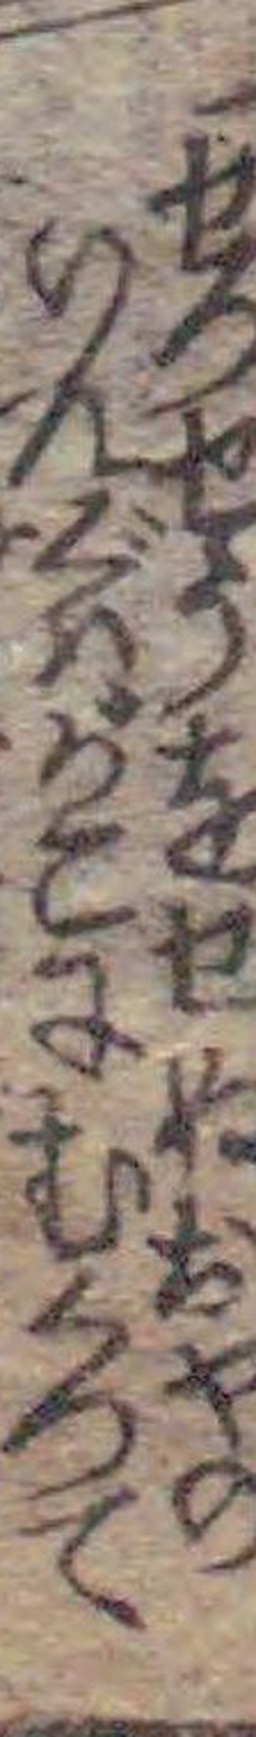いんぐはがこにむくつて
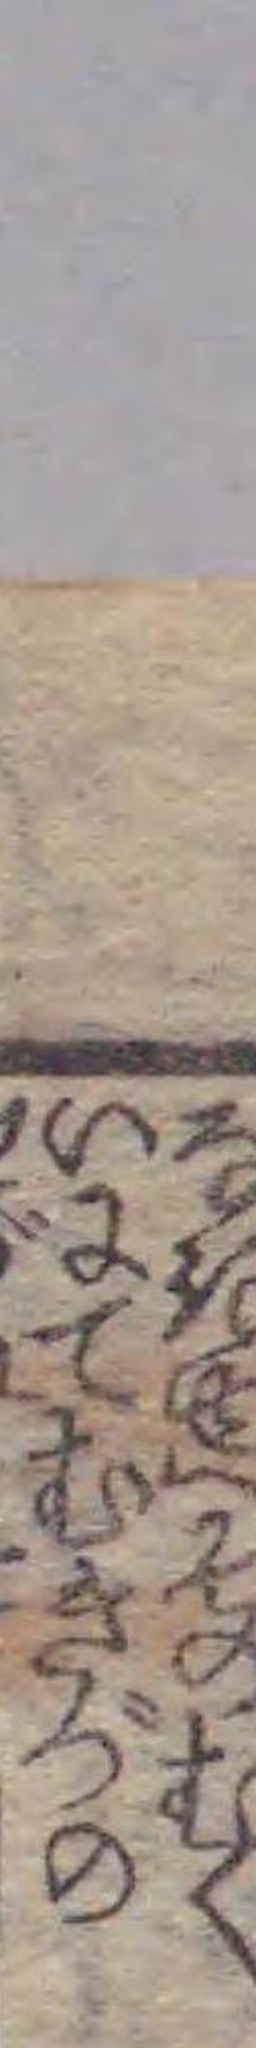いにてむきづの
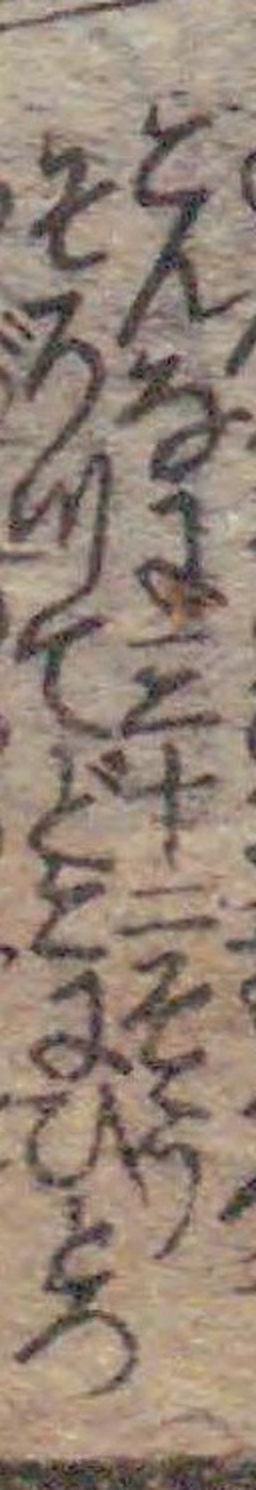そろつてどこにひとつ
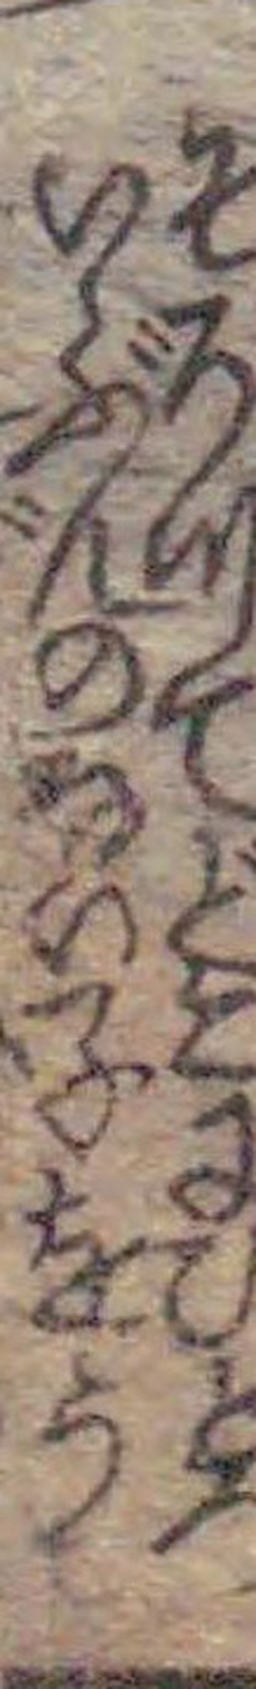いゝぶんのない子をう
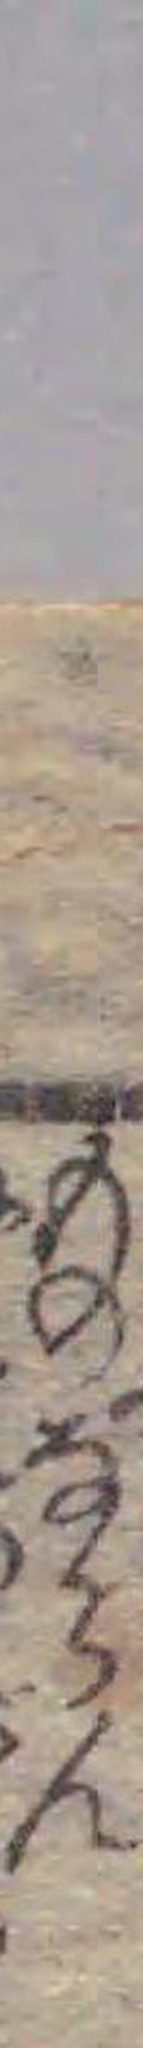ものならん
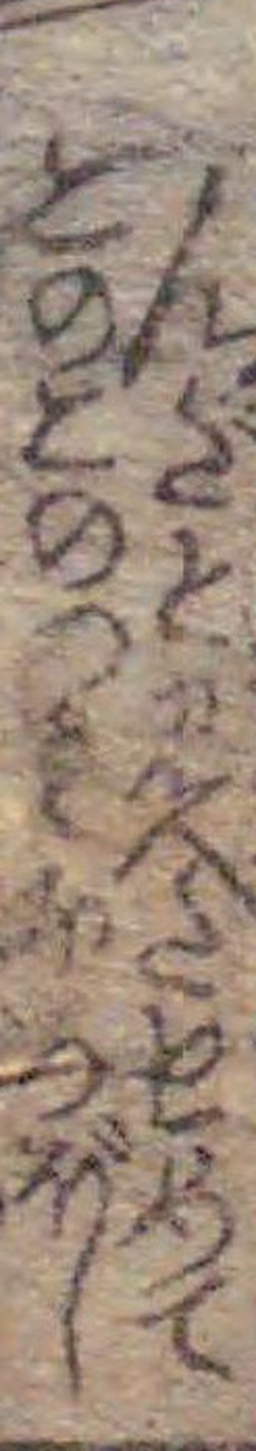このこのつみほろぼし
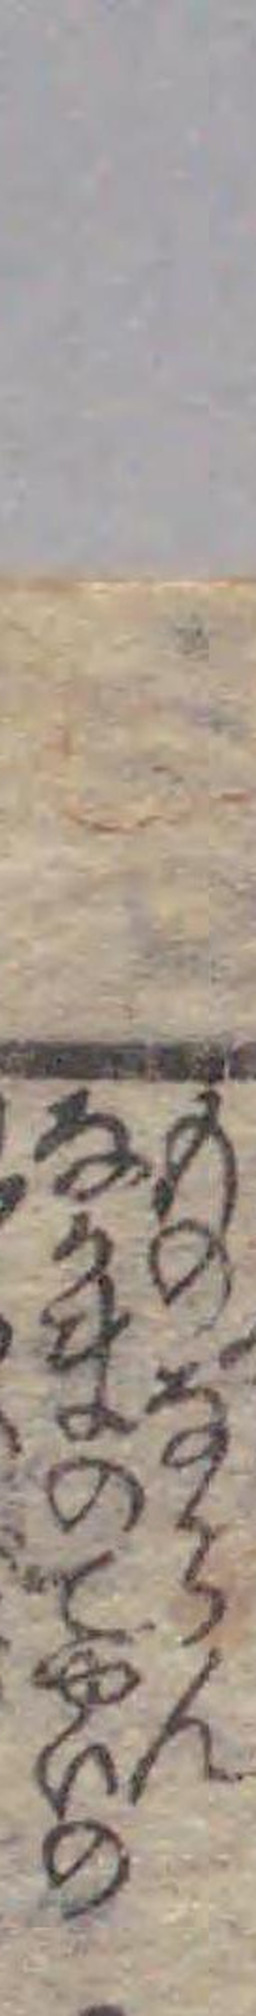なかまのてやいの
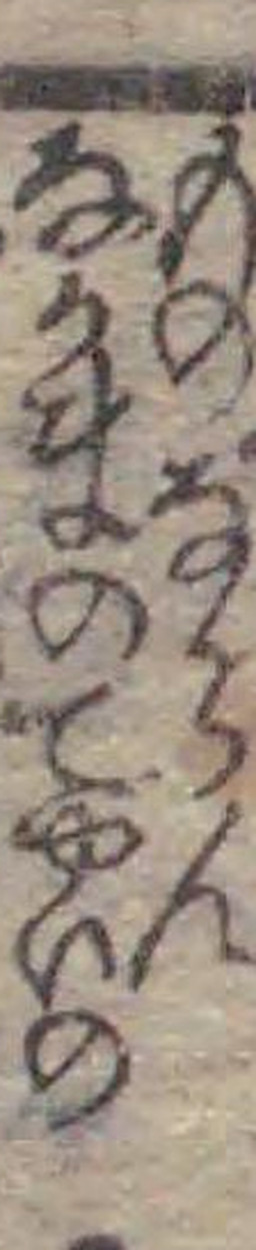なかまのてやいの
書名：化物見越松 : 2巻
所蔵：国立国会図書館 National Diet Library, JAPAN
